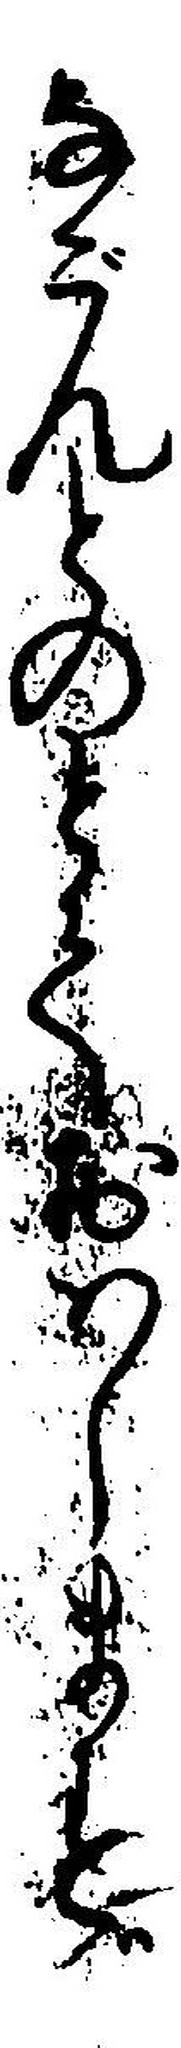なごんとのとておはします。
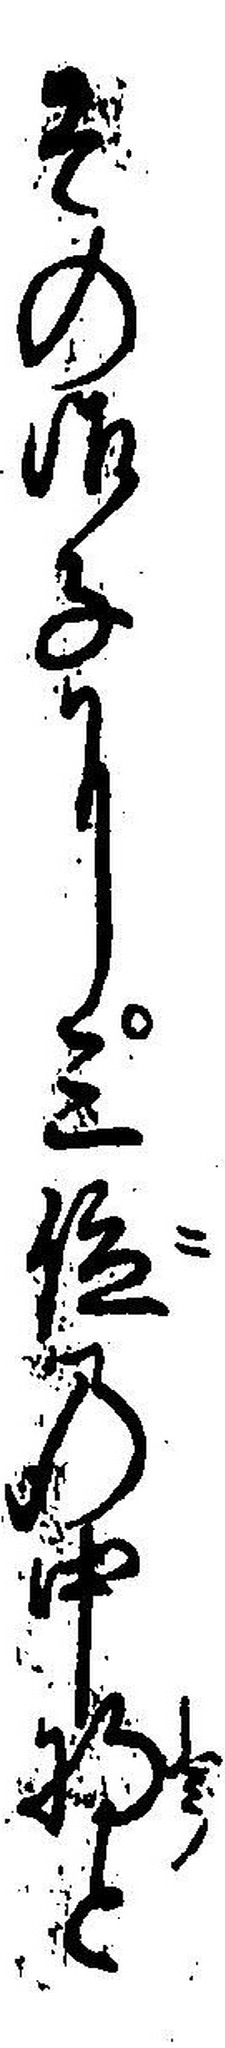その御子に。三位の中将と
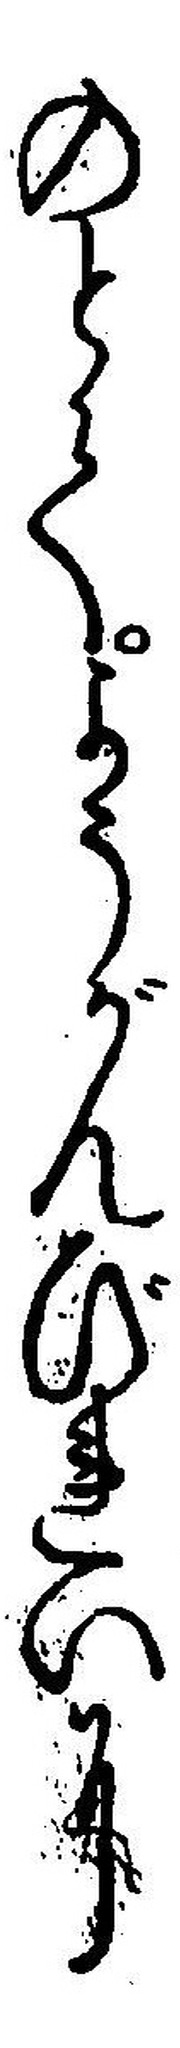のとて。ようがんびれいに
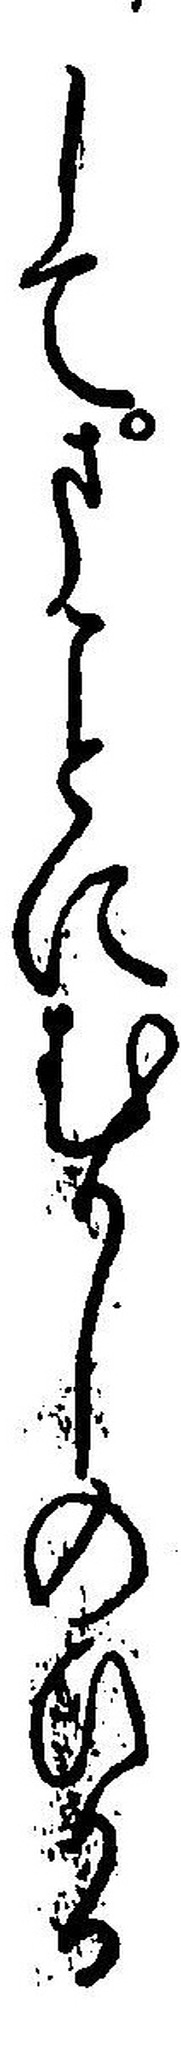して。まことにむかしのひかる
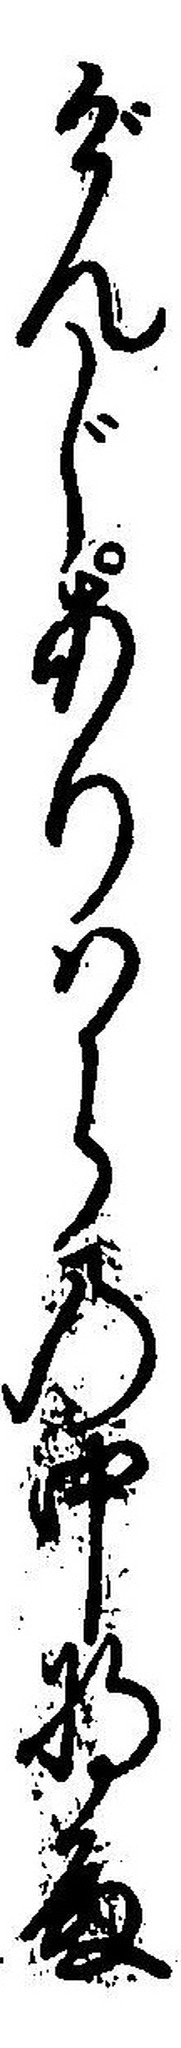げんじ。ありはらの中将殿
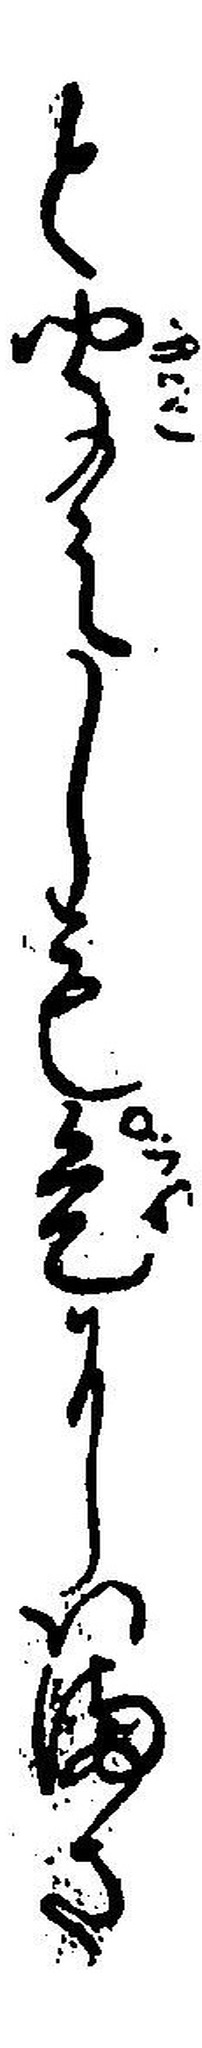と聞えしも。是にはまさ
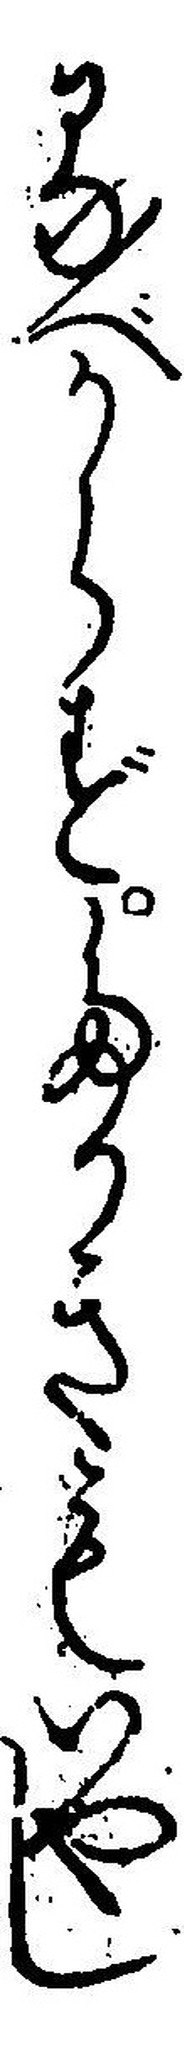るべからず。たかきもいやし
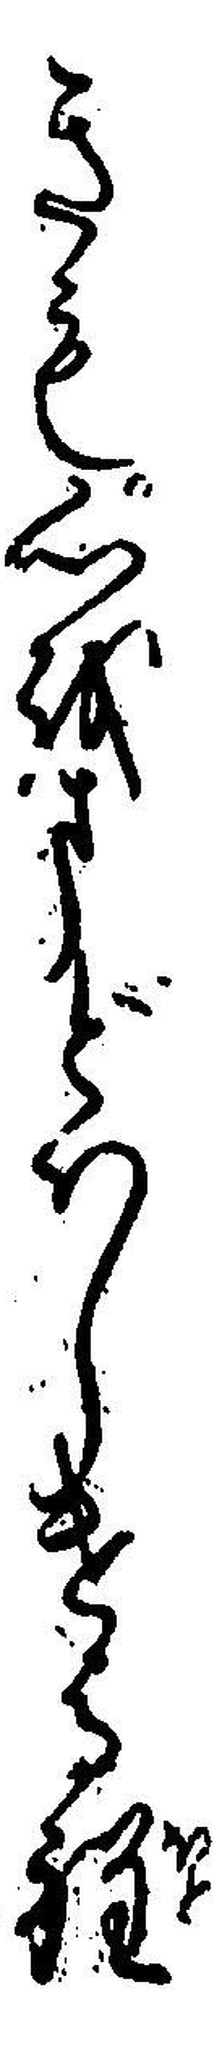きも。心をまどはしける程
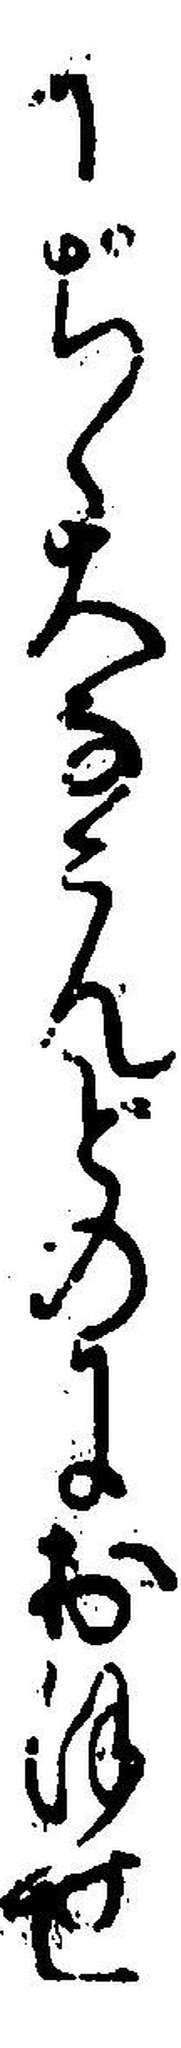に。ちゝ大なこんどのにおほせ
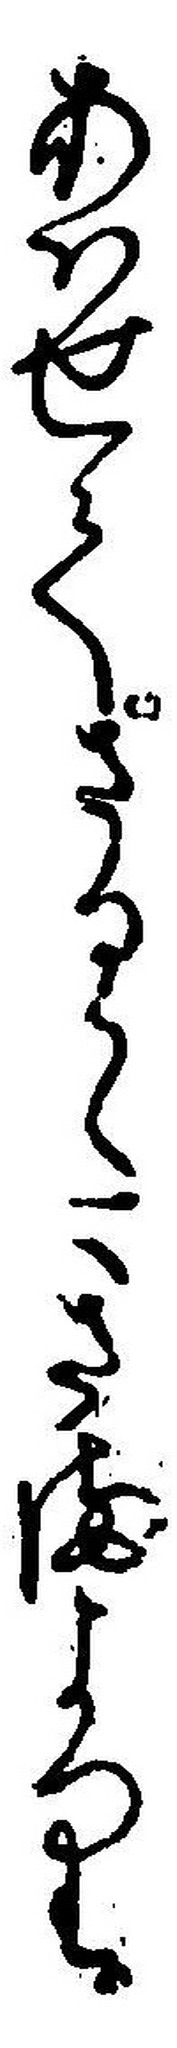あはせて。さるかたさまより。
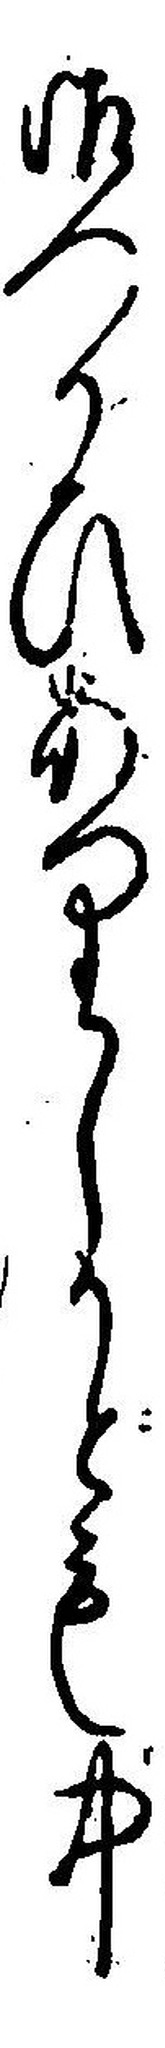御つかひありしかども。中
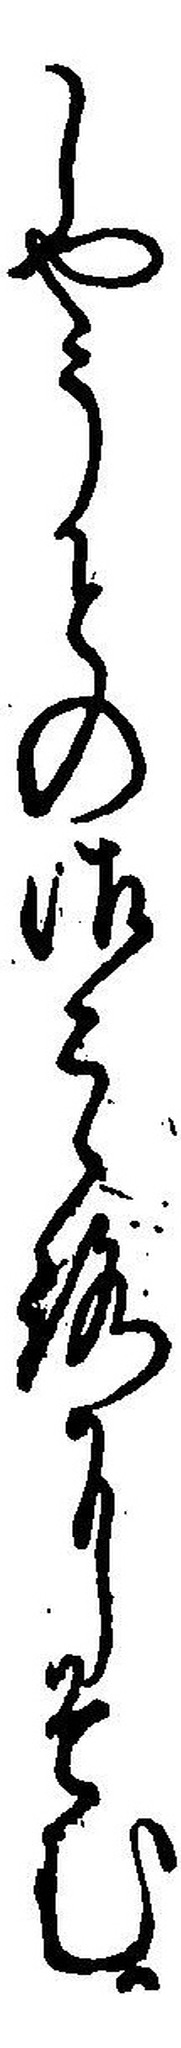しやうとの御こゝろにそむ。
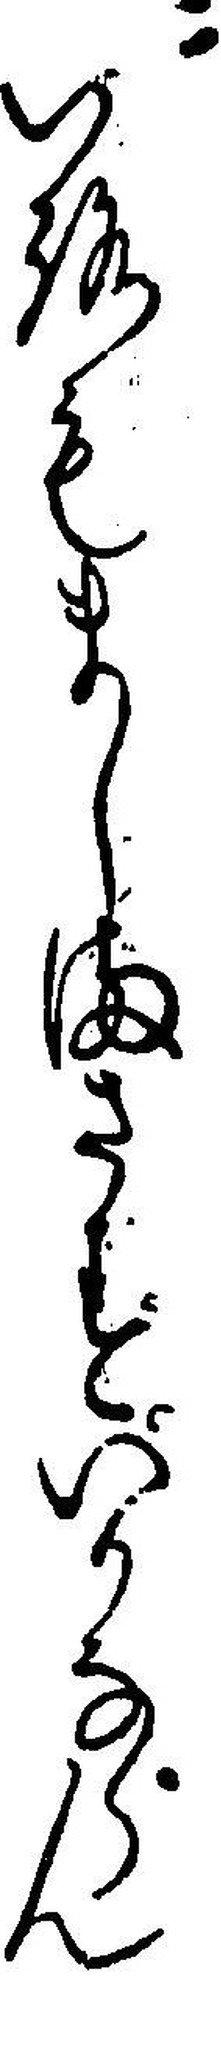いろもましまさず。いかならん
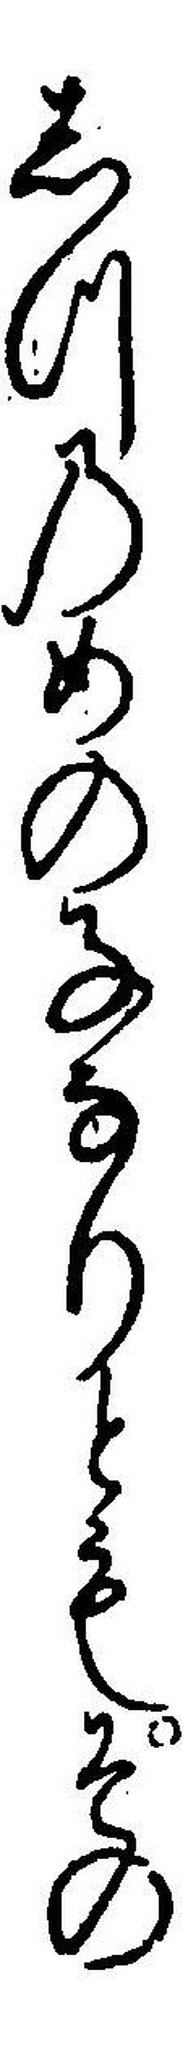しつのめの子なりとも。その
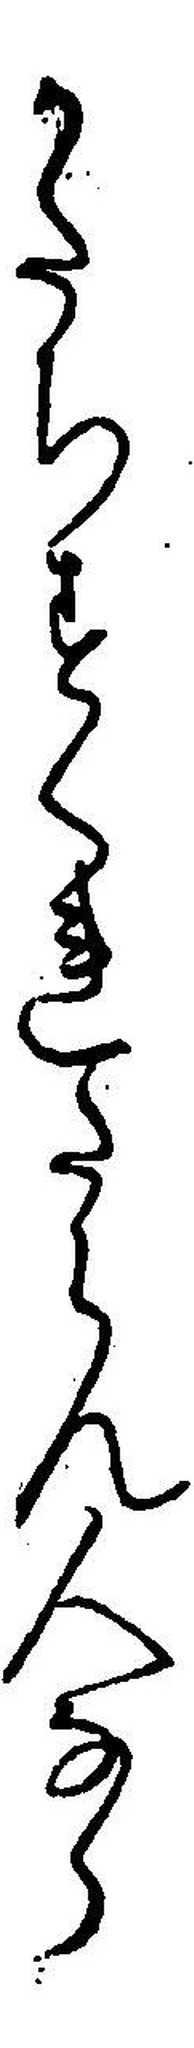かたちすくれたらん人なら
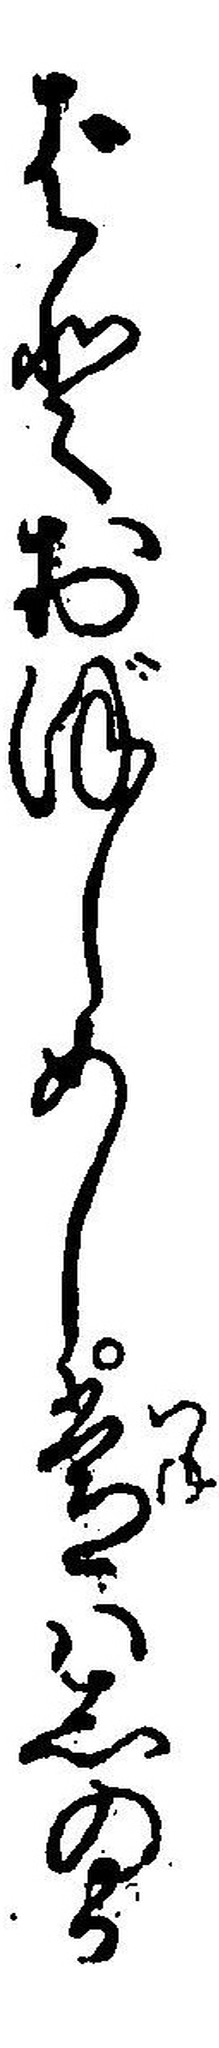ばとおぼしめし。常はしゐか
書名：木幡きつね
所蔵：東京大学総合図書館 General Library in the University of Tokyo, JAPAN
